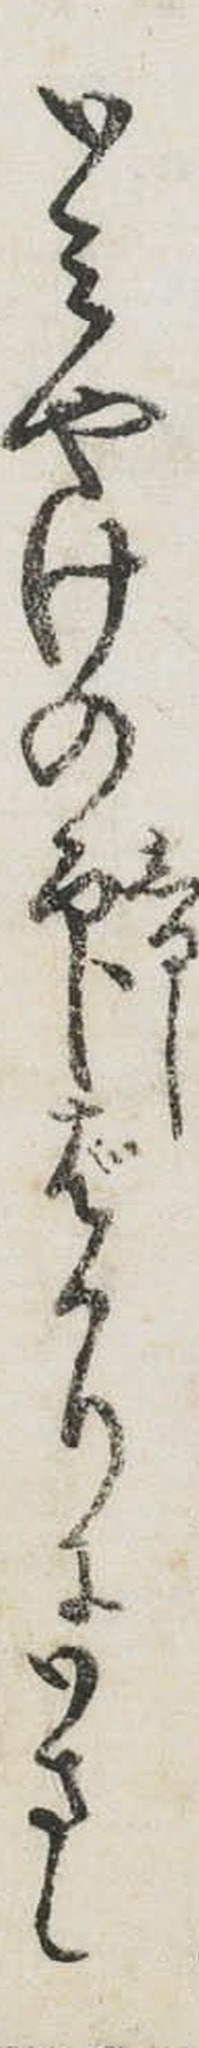御みやけの印ばかりに御さ候
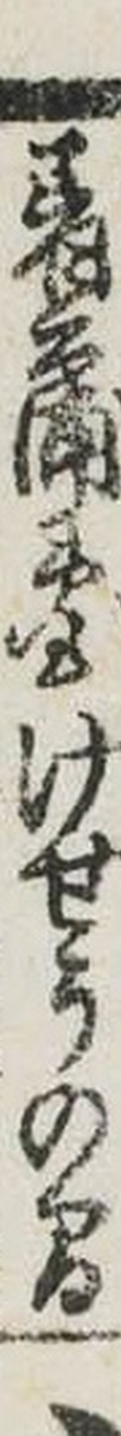着蒲団けせうの間
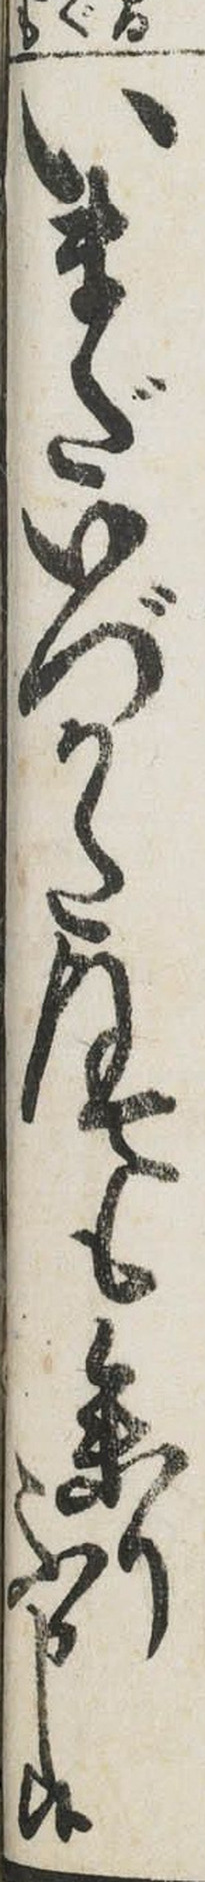いまだいづかた様へも参り不申候
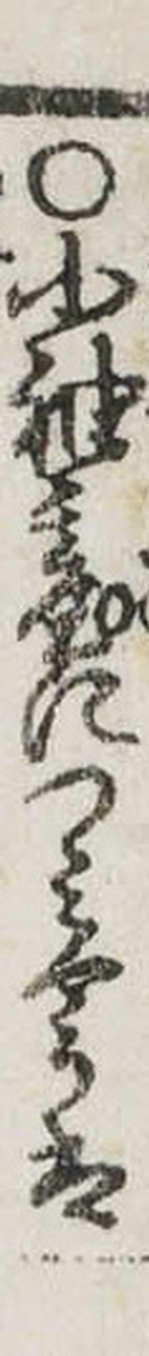○小袖台につみやうは
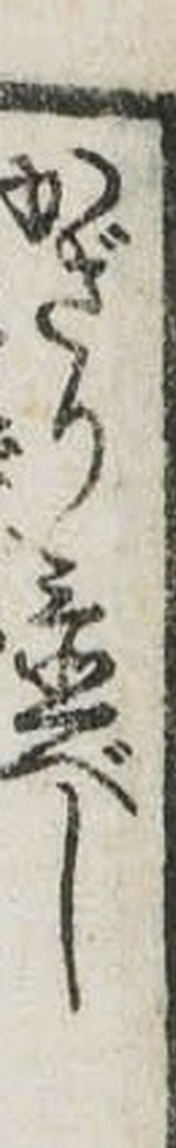かざり置べし
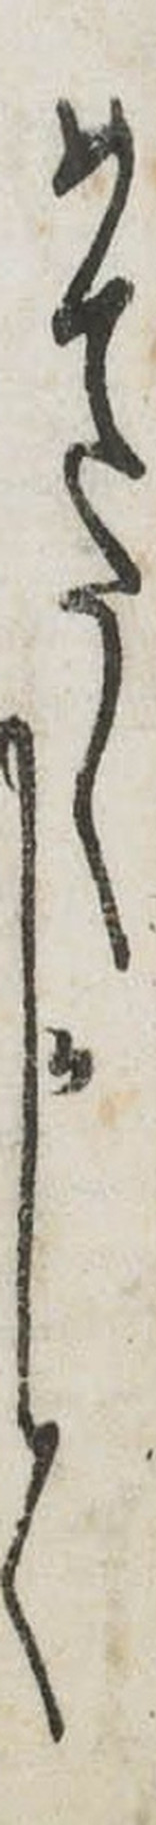めてたくかしく
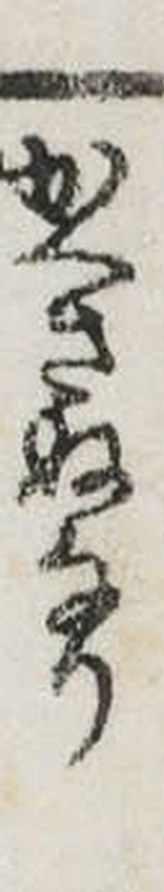かへさぬなり
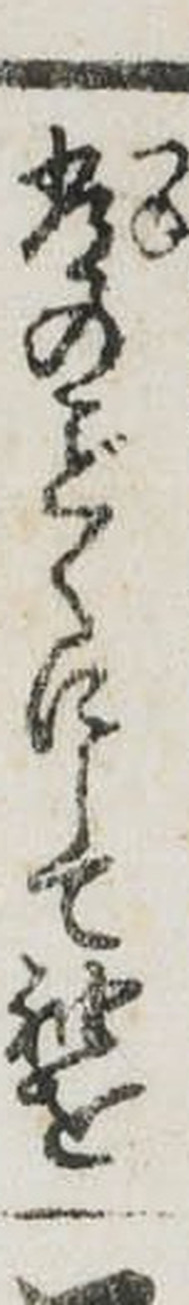常のごとくにして袖を
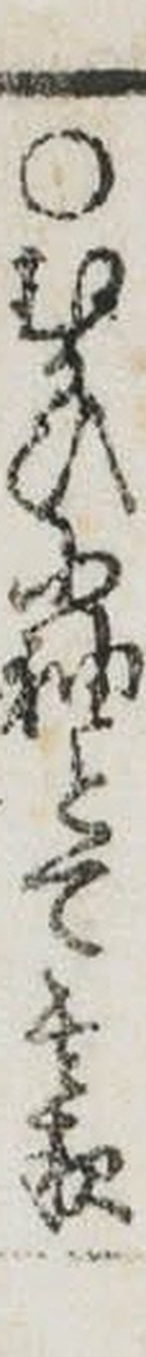○むかひ小袖とて其夜
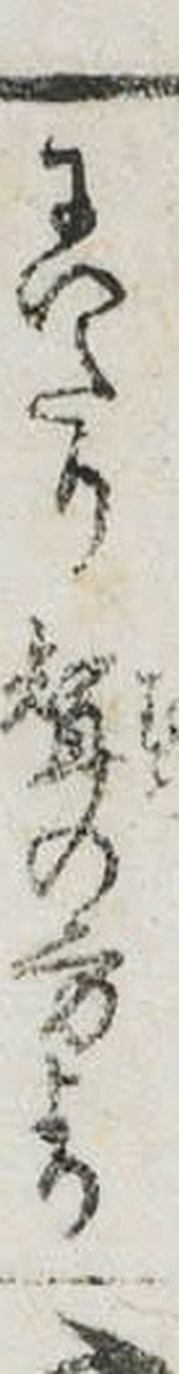にいたり聟の方より
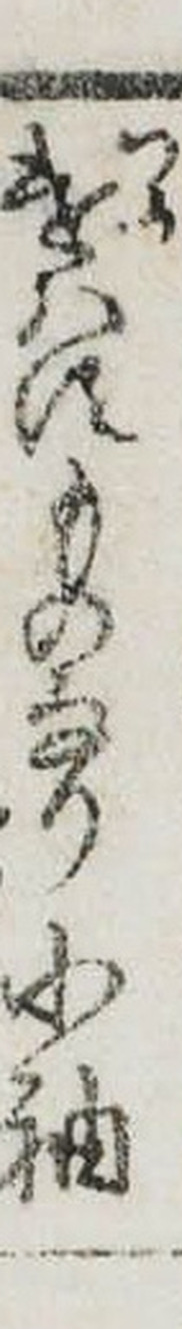遣はすものなり小袖
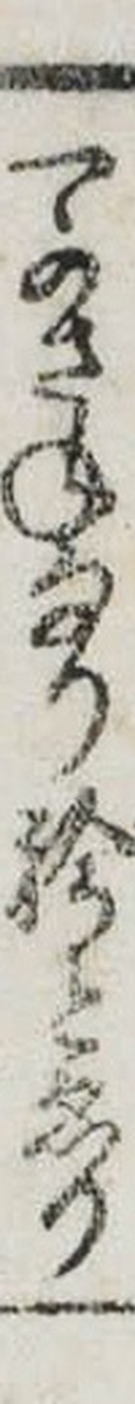一かさねなり衿とゑり
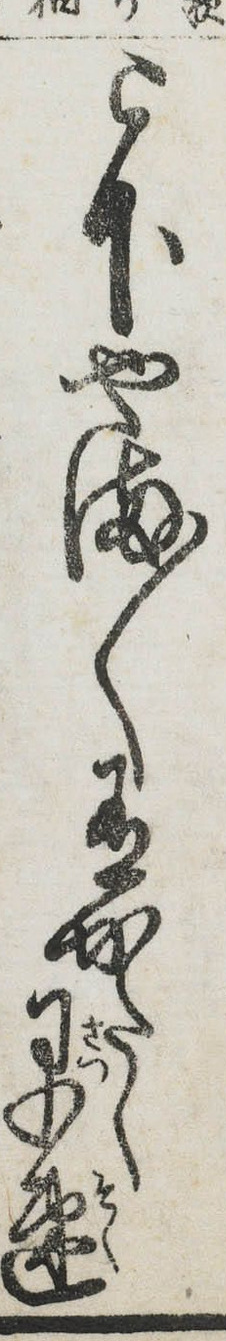被下やま〳〵有かたく早速
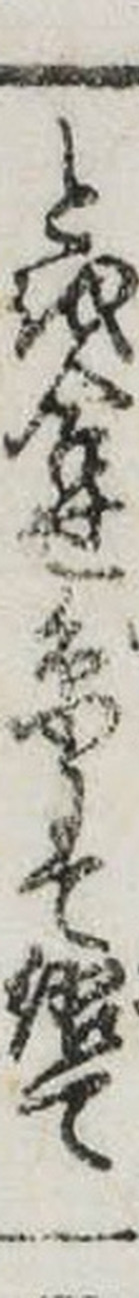とを合せ糸にて綴て
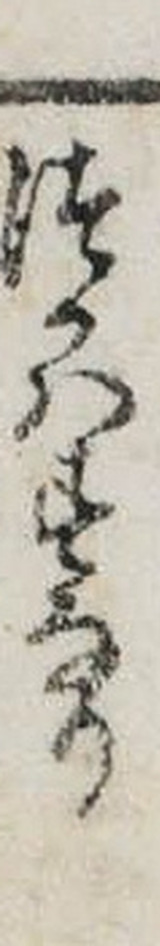つかはすなり
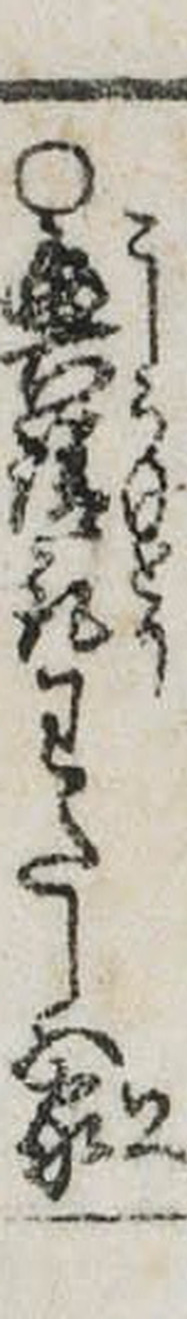○輿請取わたしは家
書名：頭書萬用婦人手紙之文言
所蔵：東京学芸大学教育コンテンツアーカイブ
